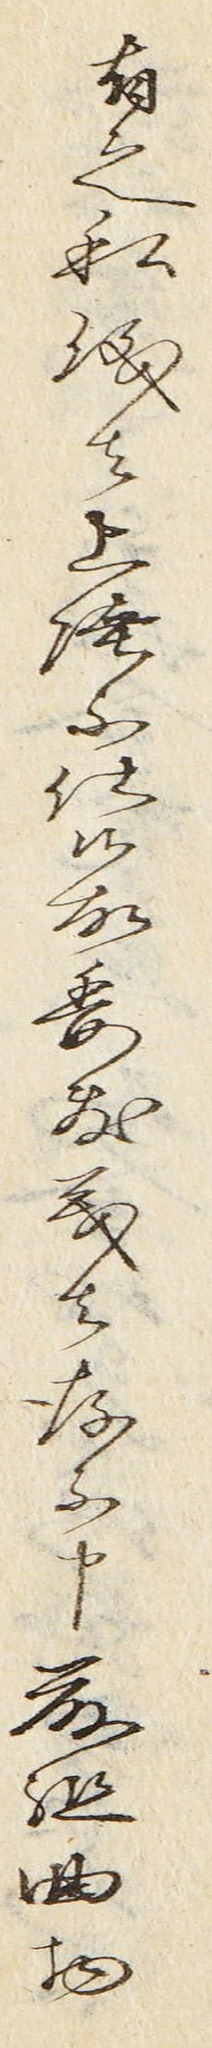有之私儀は上陸不仕候故委敷義は存不申藤組曲物
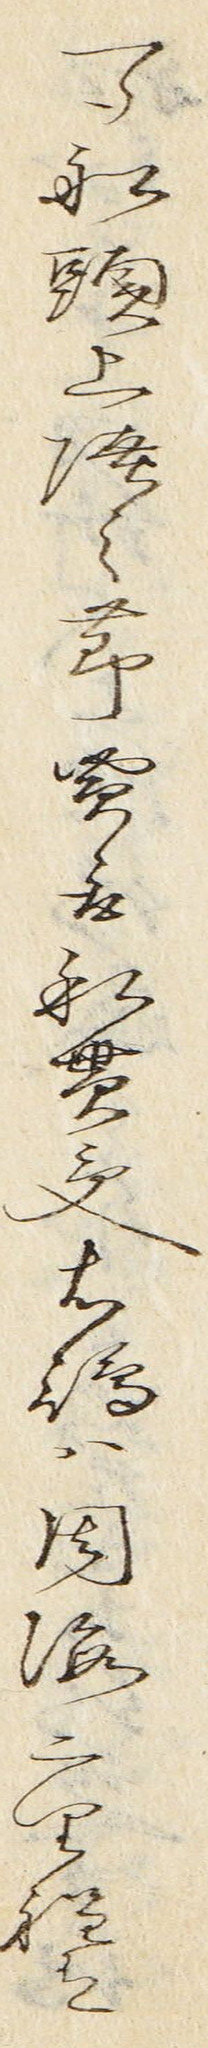一ッ船頭上陸之節買取私貰受右嶋は周海二里程有
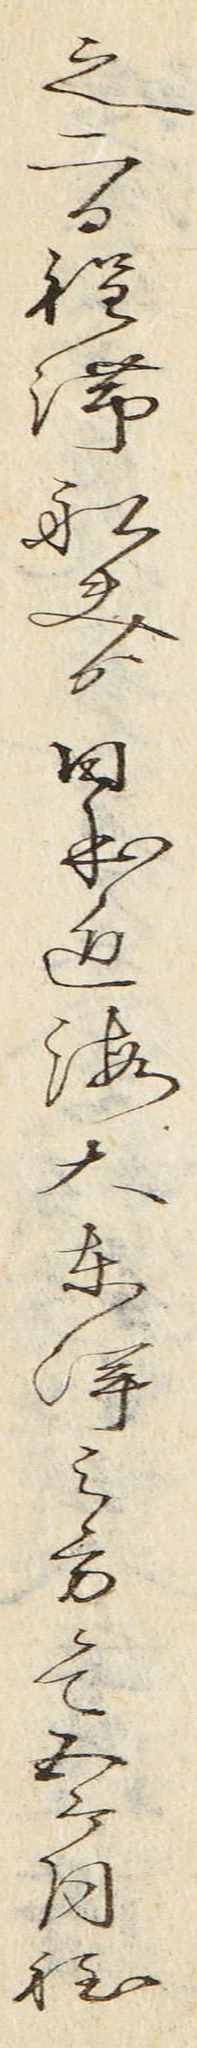之二日程滞船夫ゟ日本近海大東洋之方にて五ヶ月程

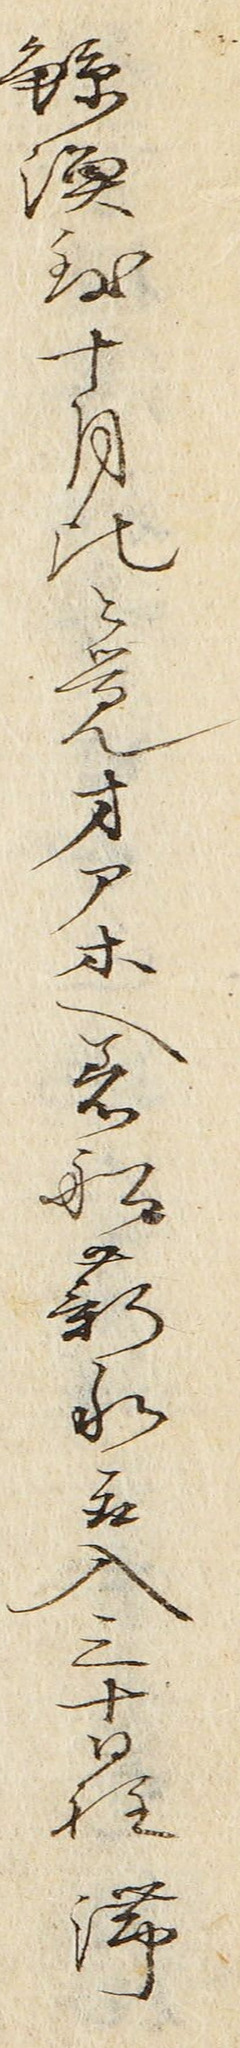鯨漁致十月比と覚オアホへ着船薪水取入三十日程滞
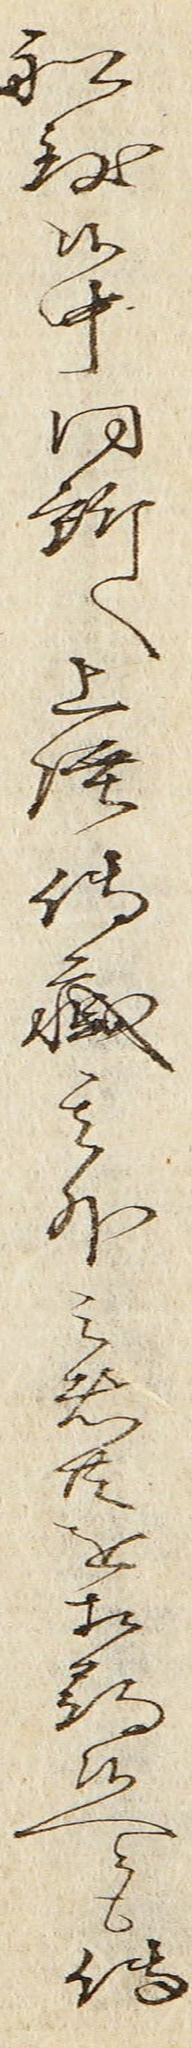船致候中同所へ上陸伝蔵其外之者共を相尋候へとも伝
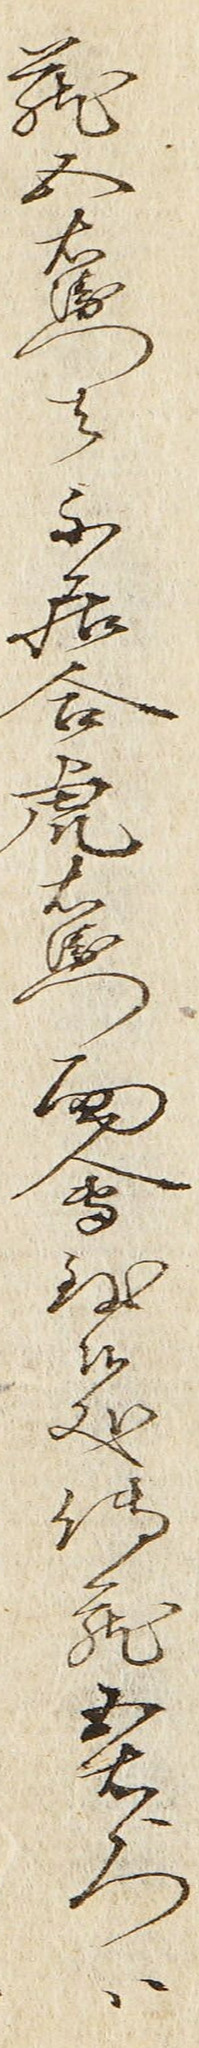蔵五右衛門は不居合虎右衛門面会致候伝蔵五右衛門は
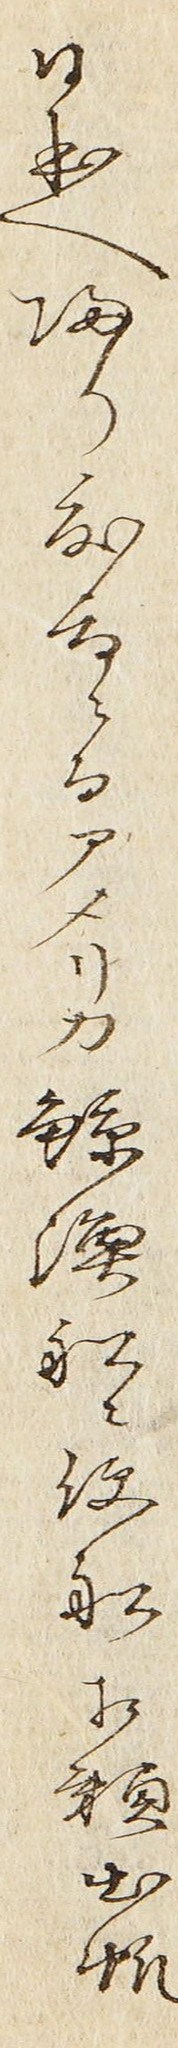日本へ帰り度旨に而アメリカ鯨漁船に便船相頼出帆
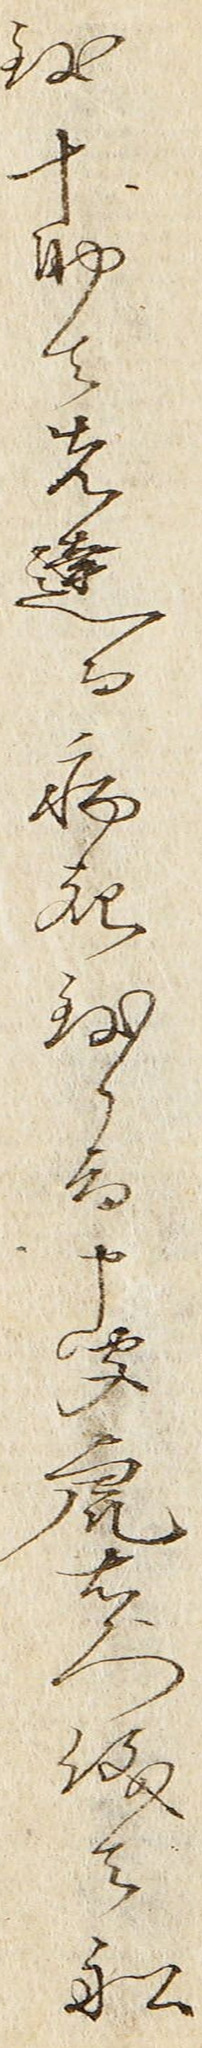致十助は先達而病死致候旨申聞虎右衛門儀は船
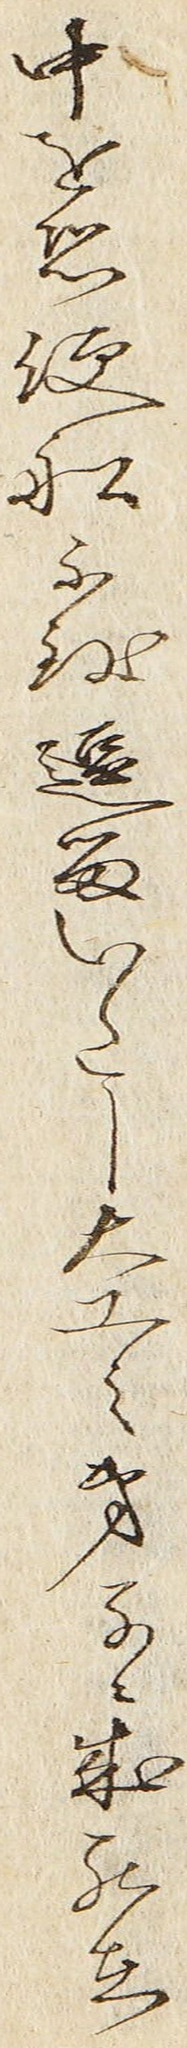中を恐便船不致逗留いたし大工之弟子に成罷在
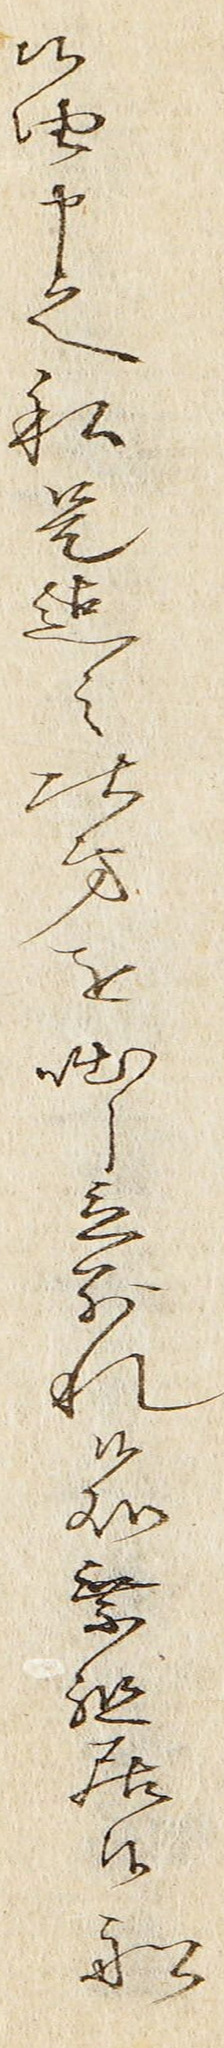候由申之私是迄之次第を咄し立別れ候処乗組居候船
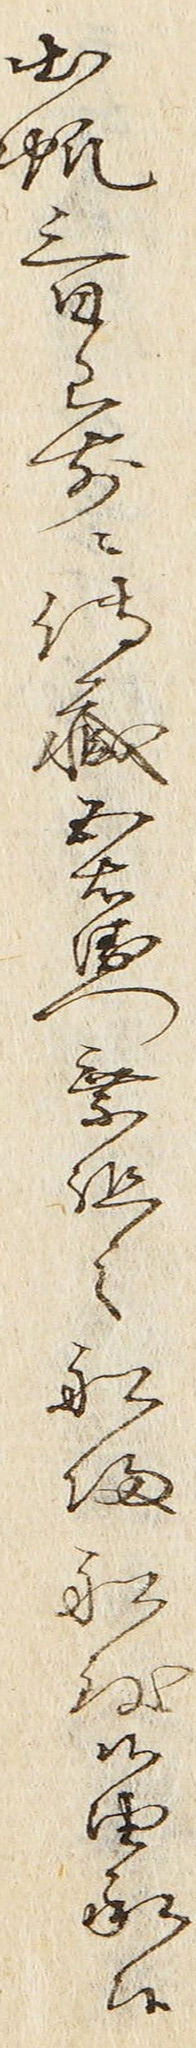出帆三日已前に伝蔵五右衛門乗組之船帰船致候由承候
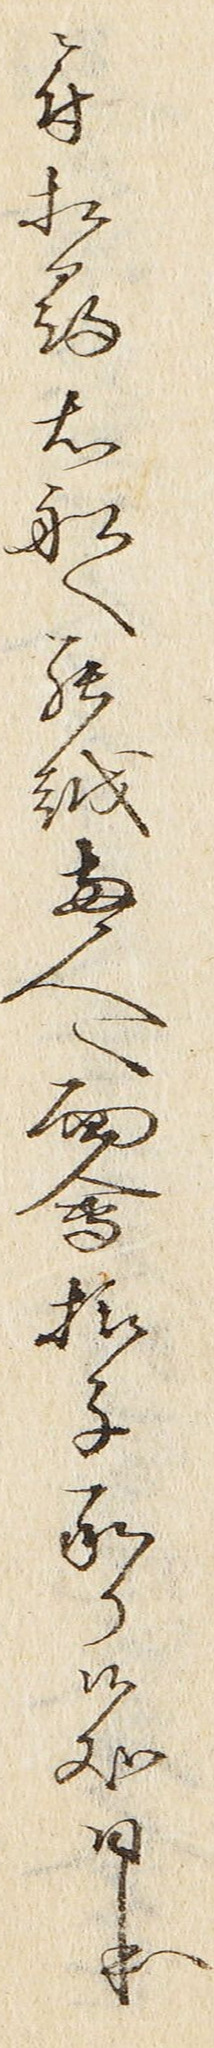に付相尋右船へ罷越両人へ面会様子承り候処日本
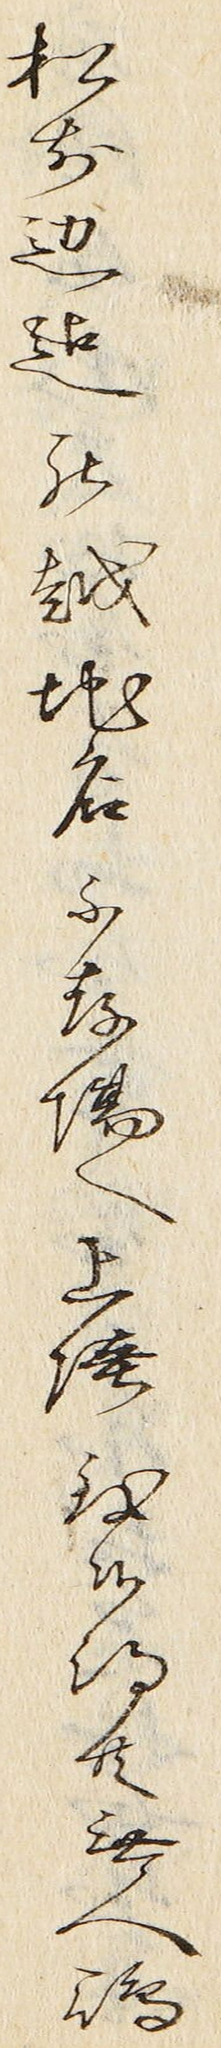松前辺迄罷越地名不存場へ上陸致候得共無人嶋
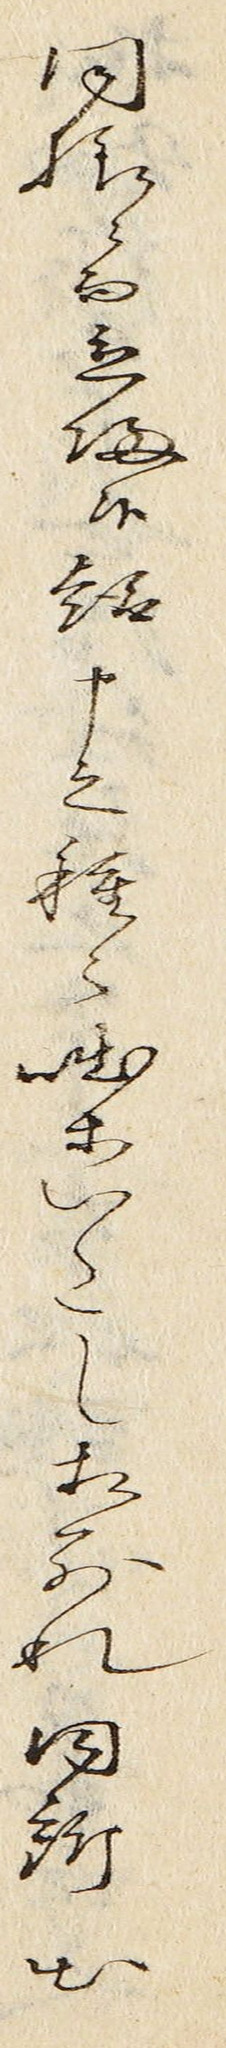同様に而立帰候趣申立種々咄等いたし相別れ同所出
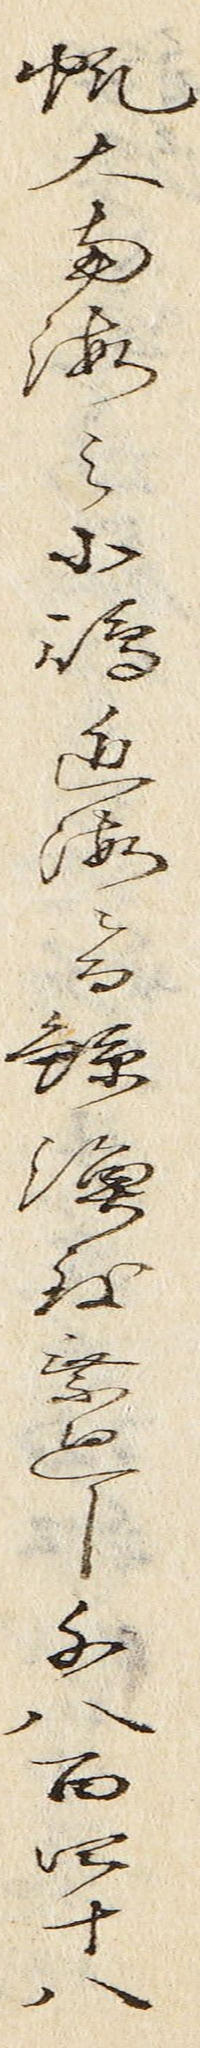帆大南海之小嶋近海に而鯨漁致乗廻し千八百四十八
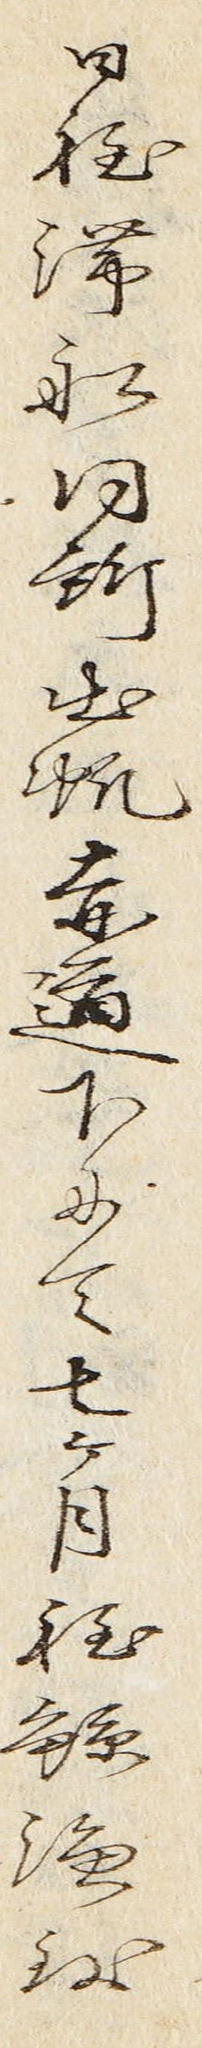日程滞船同所出帆赤道下にて七ヶ月程鯨漁致
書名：土佐中浜万次郎漂流記
